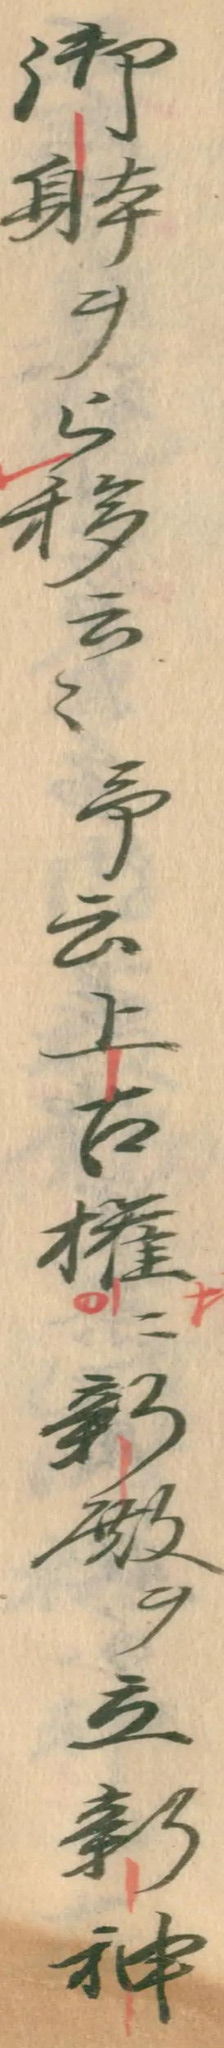御-体ヲ被移云々予云上-古権-￮ニ新-殿ヲ立新-神-
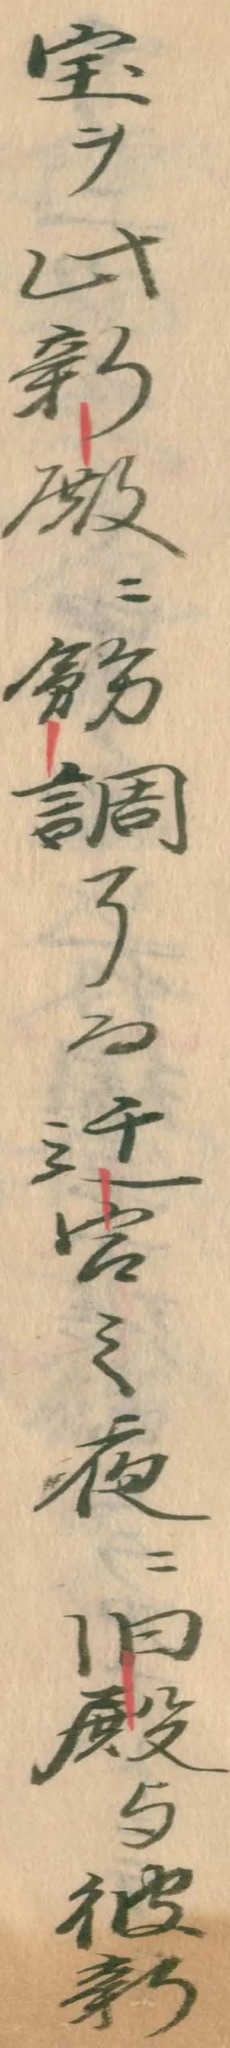宝ヲ此新-殿ニ飾_調了而迁-宮之夜ニ旧-殿与彼新
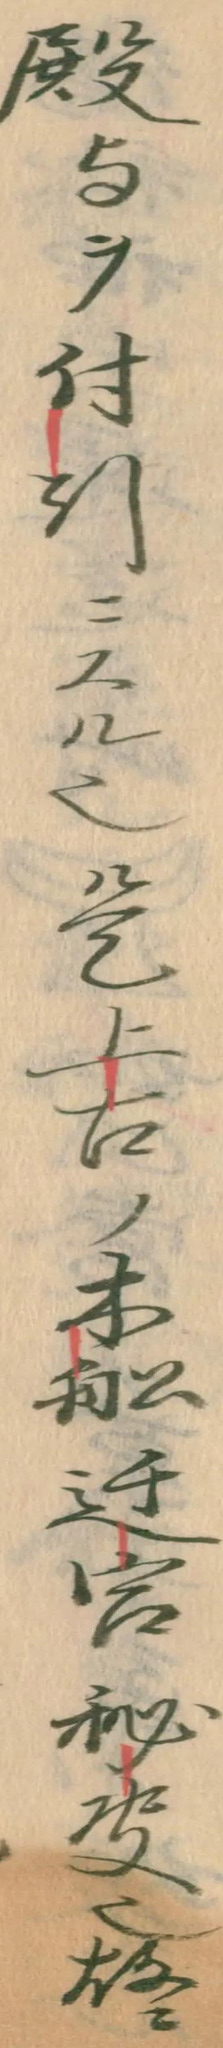殿与ヲ付_引ニスル也是上-古ノ木_船迁-宮秘-決也故ニ
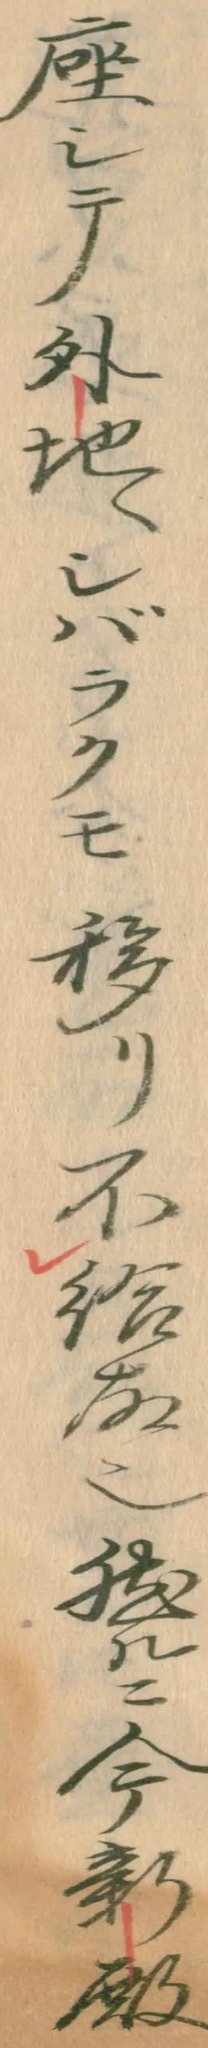座シテ外-地ヘシバラクモ移リ不給故也然ルニ今新-殿
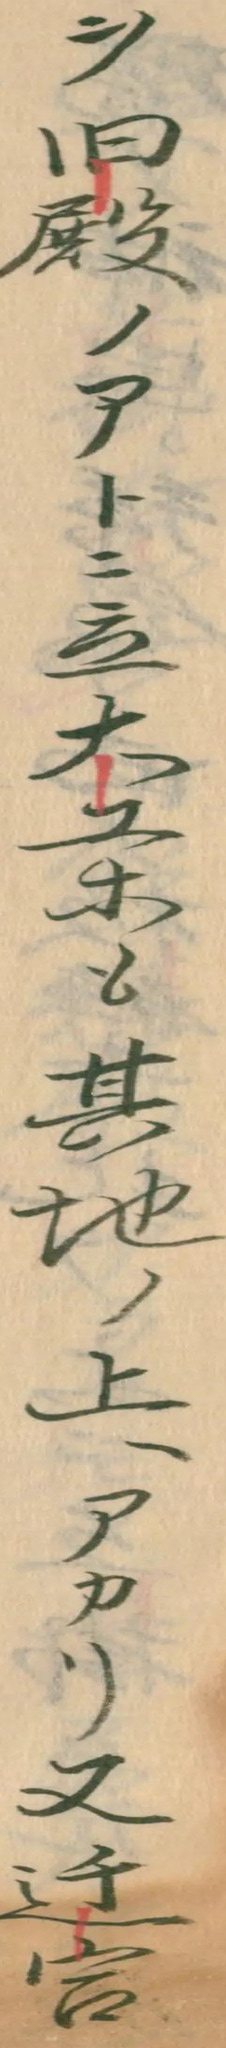ヲ旧-殿ノアトニ立大-工等も其地ノ上へアカリ又迁-宮
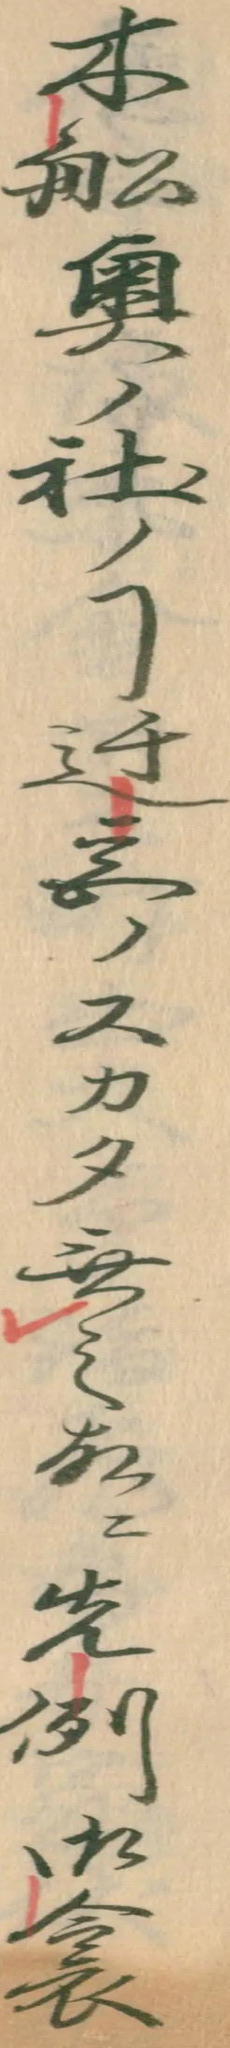木_船奥ノ社ノコト迁-宮ノスカタ無之故ニ先-例御_衾
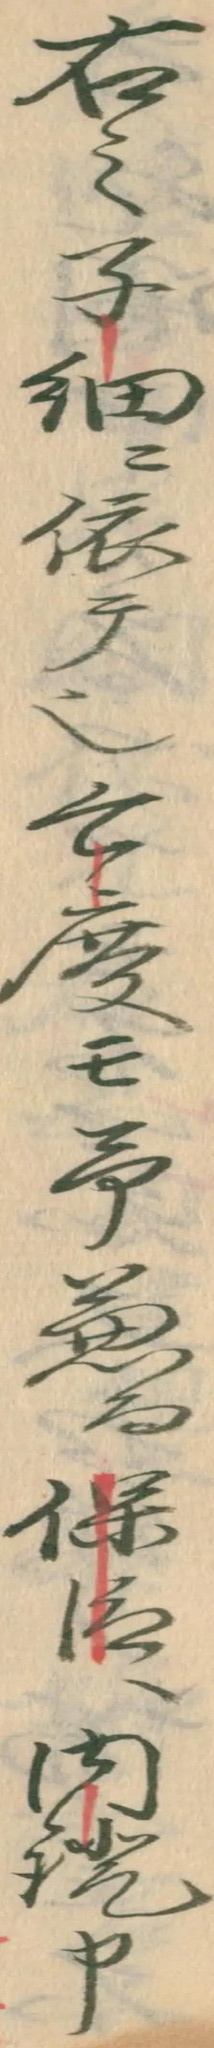右之子-細ニ依テ也今-度モ予兼而保臣へ内-証申
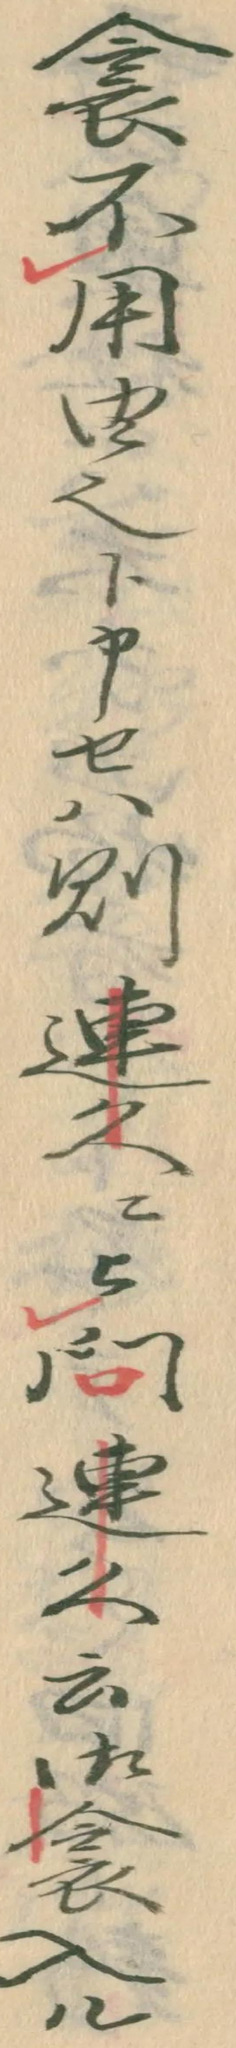衾不用由也ト申セハ則連久ニ被問連久云御_衾入ル

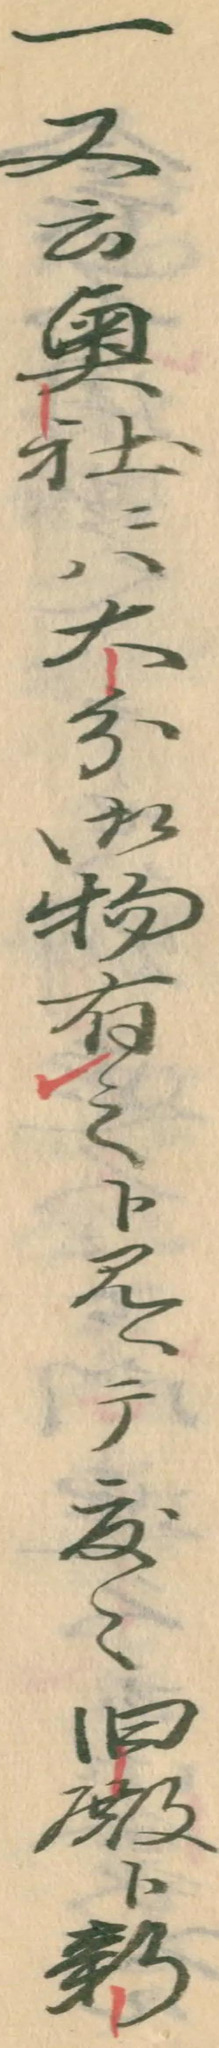一又云奥_社ニハ大-分御物有之ト見へテ度々旧-殿ト新-
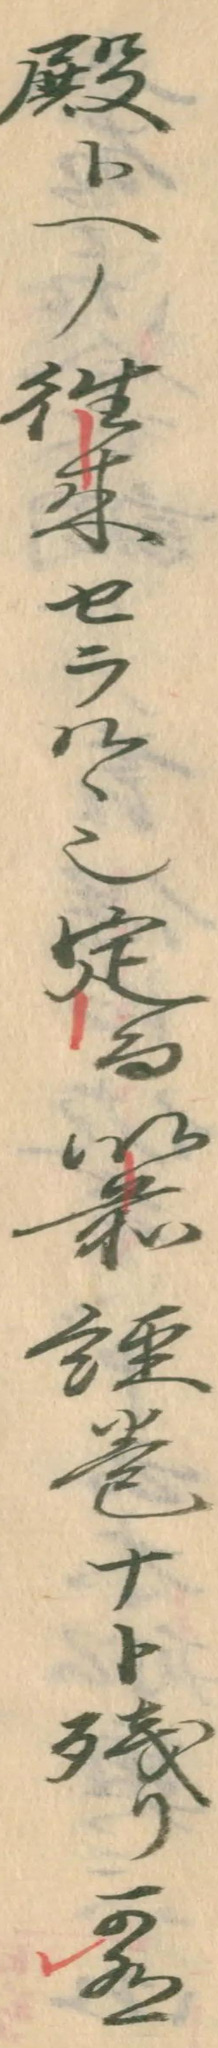殿トヘノ往-来セラルヽ也定_而以-前経巻ナト残リ可有
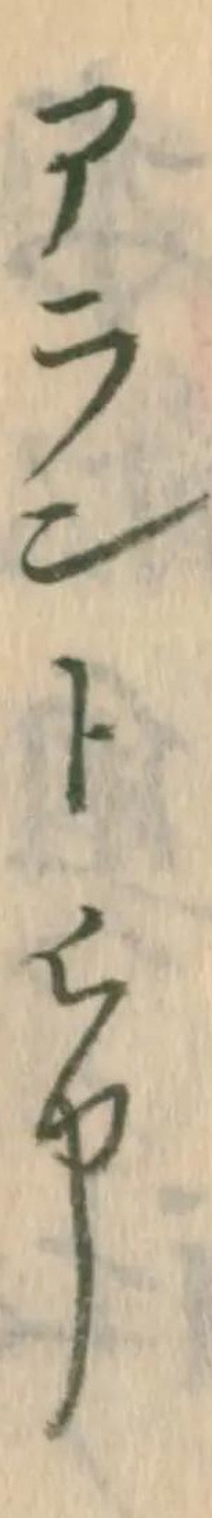アラント被申
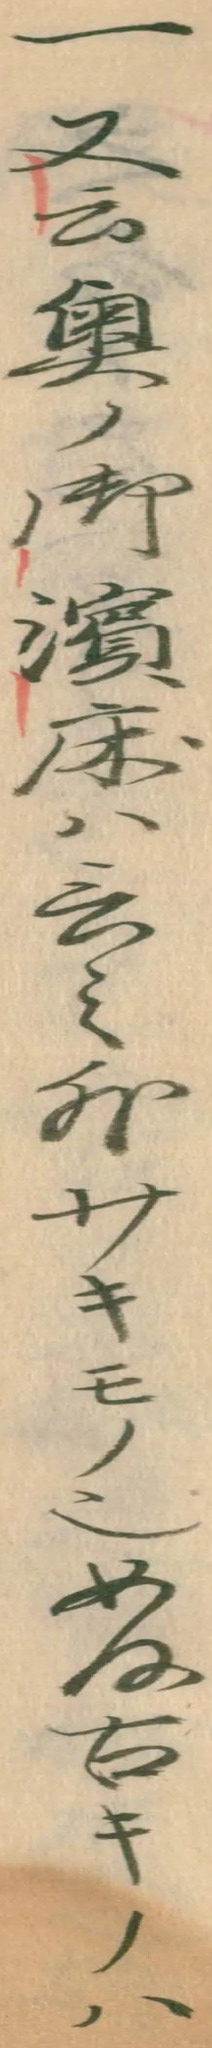一又_云奥ノ御_浜_床ハ言之外少キモノ也如何古キノハ
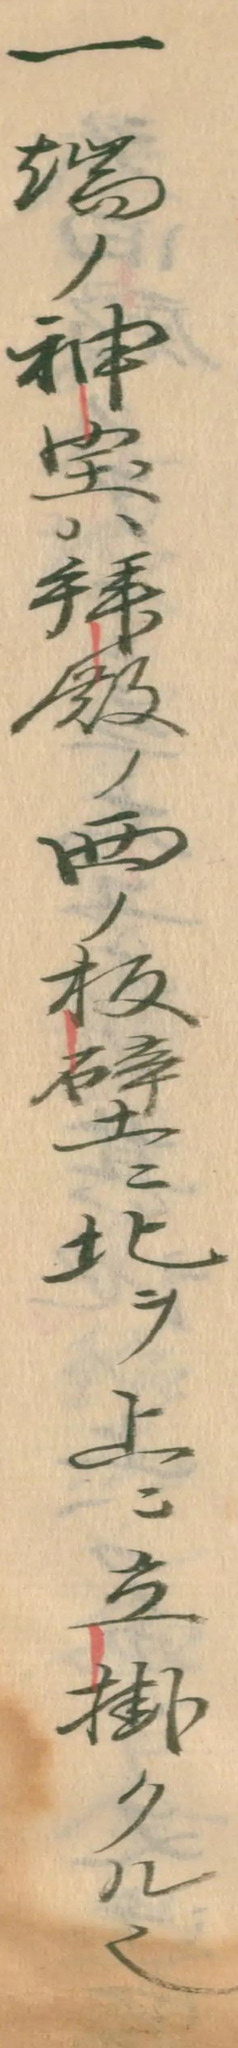一端ノ神-宝ハ拝-殿ノ西ノ板_壁ニ北ヲ上ニ立_掛クル也
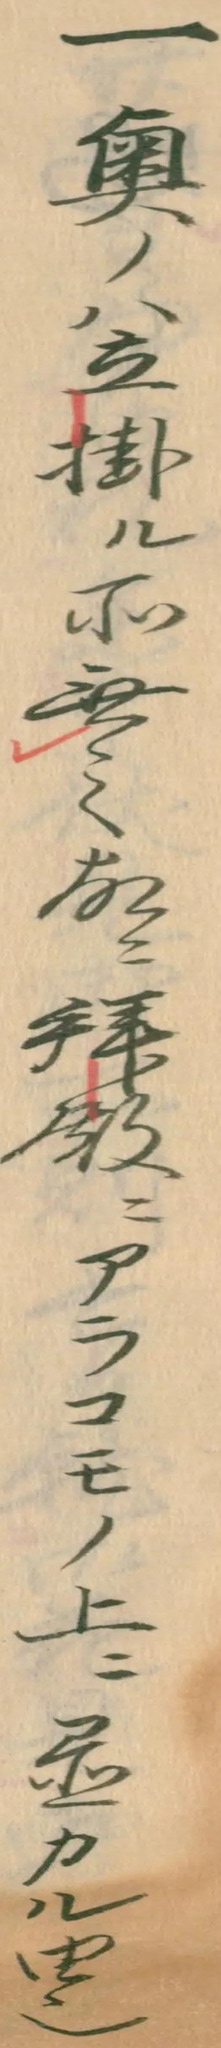一奥ノハ立_掛ル所無之故ニ拝-殿ニアラコモノ上ニ置カル由也
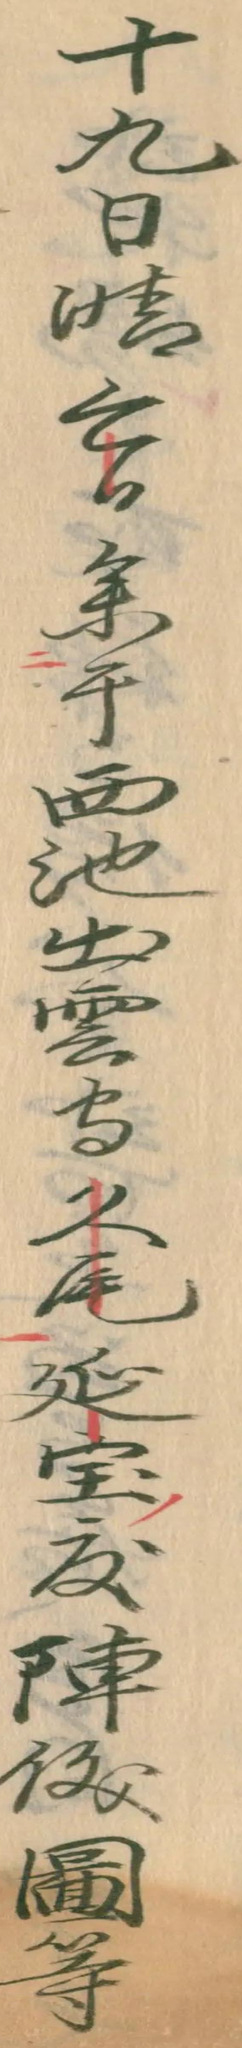十九日晴今-日参于西池出雲守久尾延-宝度陣儀図等
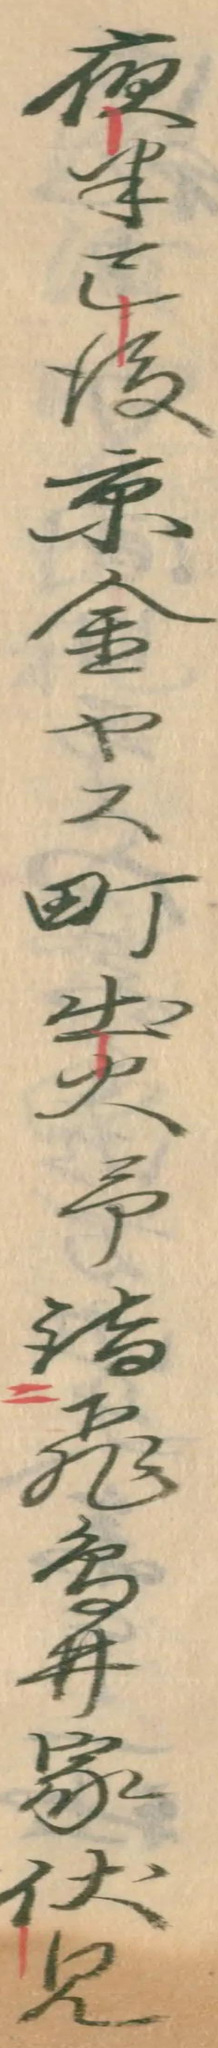夜-半已-後京金ヤス町出-火予詣飛鳥井家伏_見
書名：賀茂社記録. 第16冊
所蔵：国立国会図書館 National Diet Library, JAPAN
